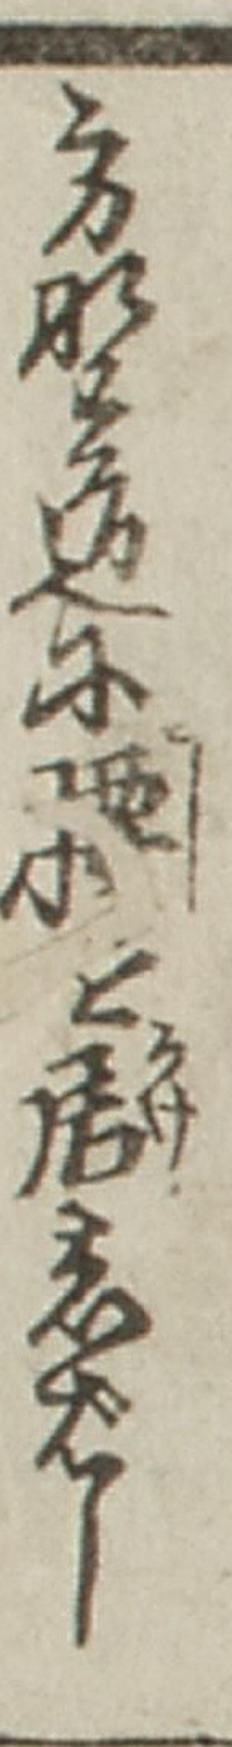方野道に腰を居しばし

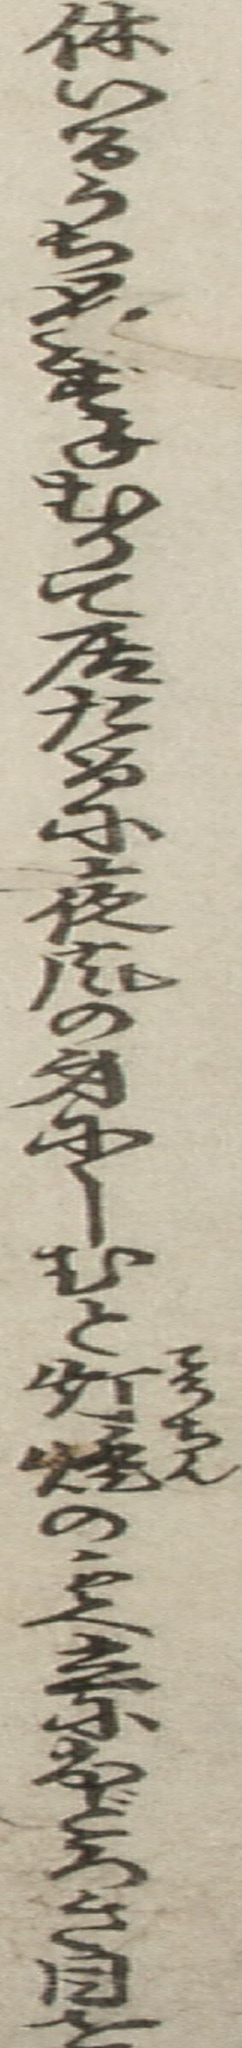休いるうち思はずねむりて居たるに夜風の身にしむと灯燈のもへ立におどろき目を
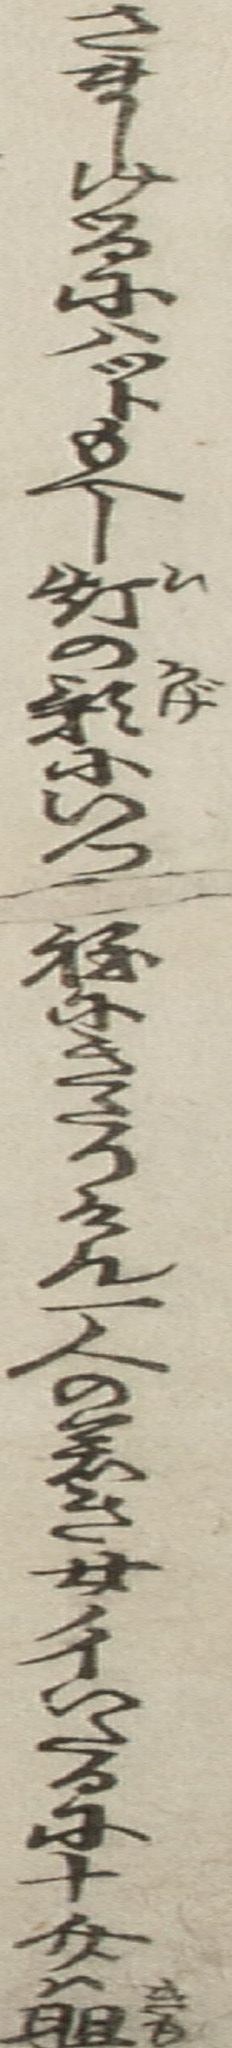さましけるにハツトもへし灯の影にいつの程にきたりけん一人の若き女彳いたるに十介は胆
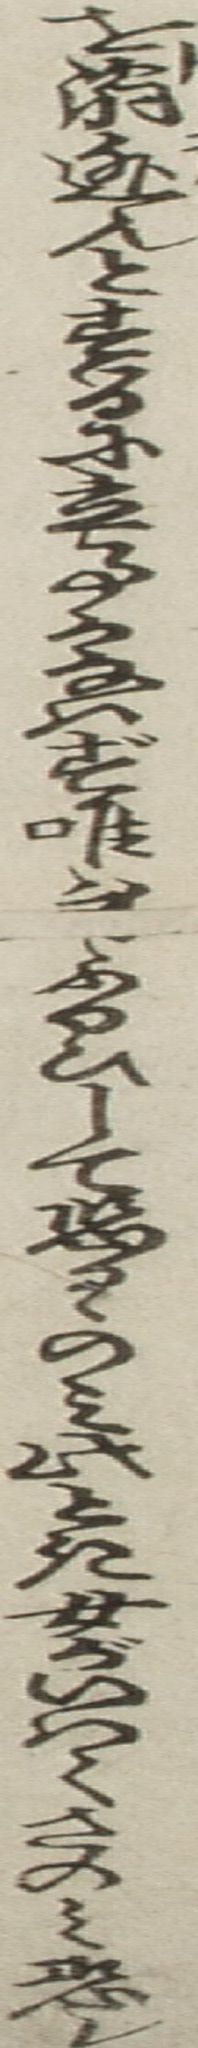を消逃んとするに立事かなはず唯身ふるひして恐るゝのみ此とき女がいはくさのみ恐レ
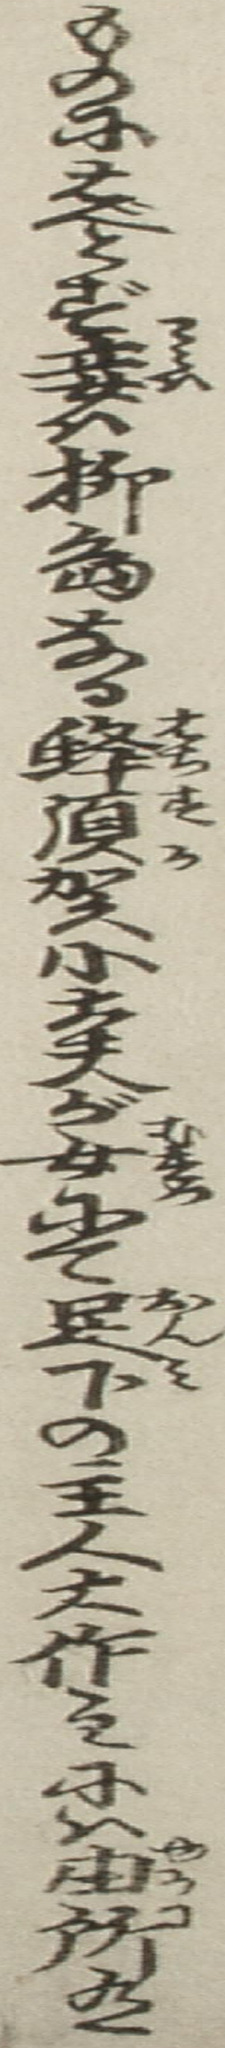ものにはべらず妾は柳島なる蜂須賀小太夫が女にて足下の主人大作主には由所有
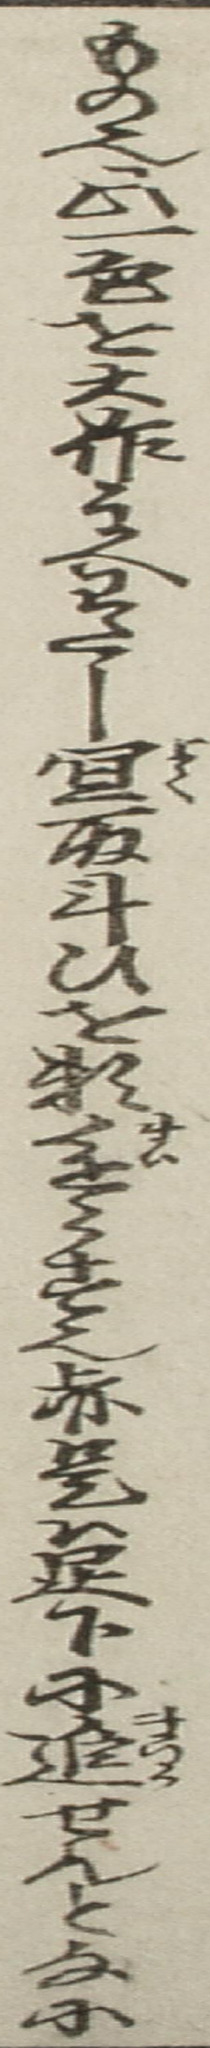もの也此一包を大作主へわたし冝取計ひを頼進らす也亦是は足下に進せんとなに
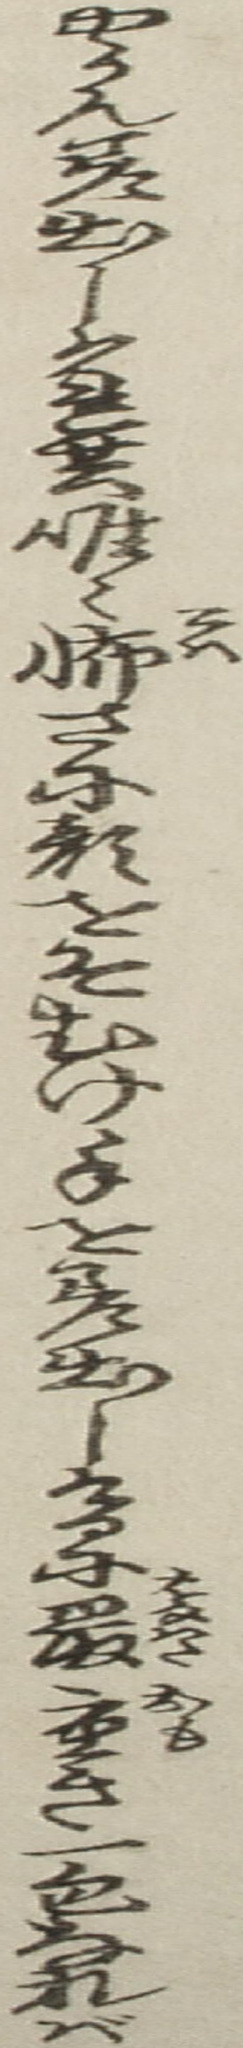やらん差出しけれ共唯々怖さに顔をそむけ手を差出しけるに最重き一包なれば
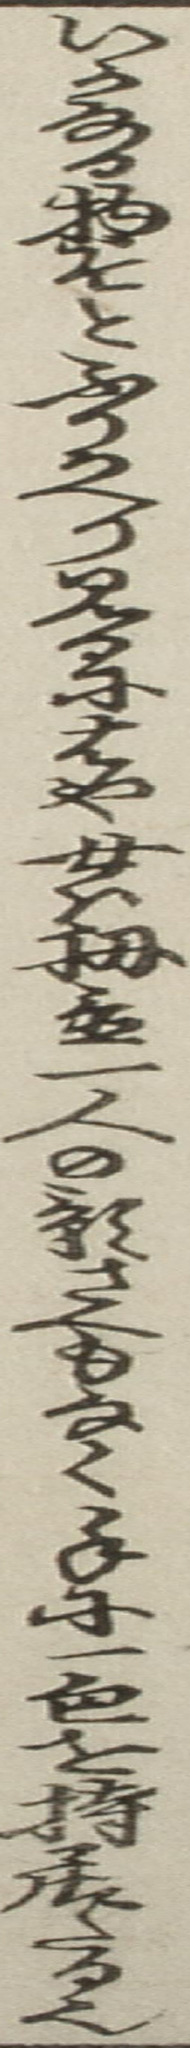いかなる物ぞとふりかへり見るにはや女は扨置一人の影さへもなく手に一包を持居たる也
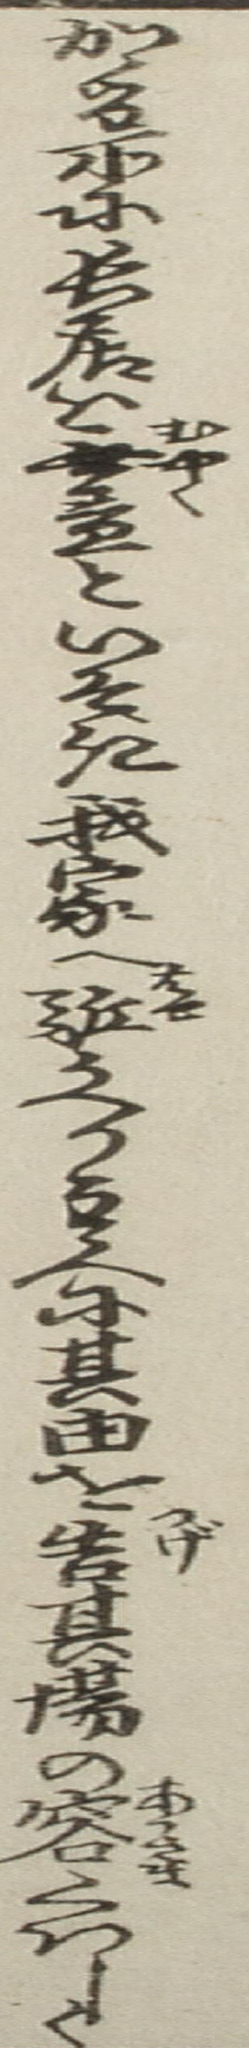かゝる所に長居は無益といそぎ我家へ駈かへり主人に其由を告其場の容くはしく
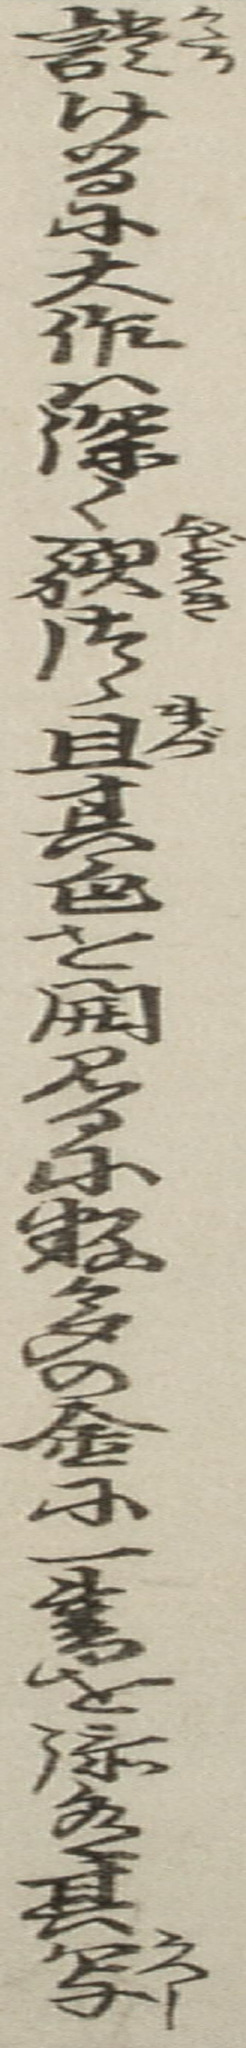談けるに大作は深く駭つゝ且其包を開見るに数多の金に一書を添有其写
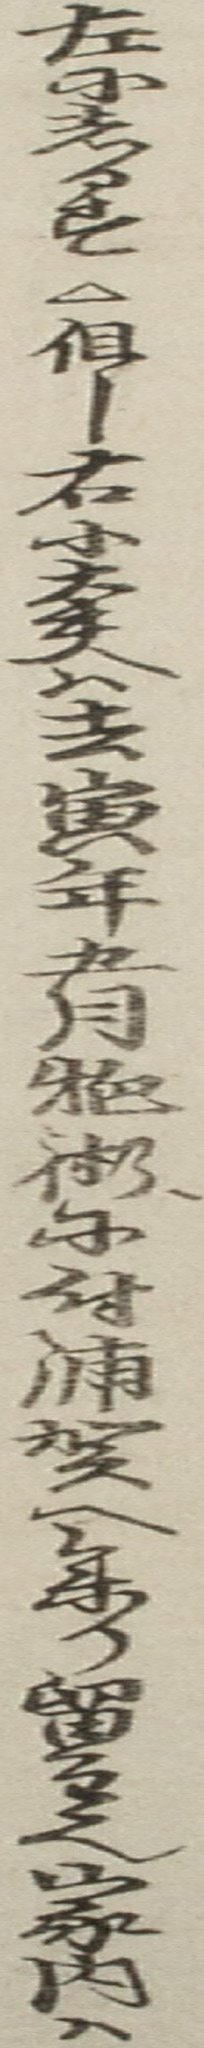左にしるす△但し右小太夫は去寅年五月施術に付浦賀へ参り留る也家内は
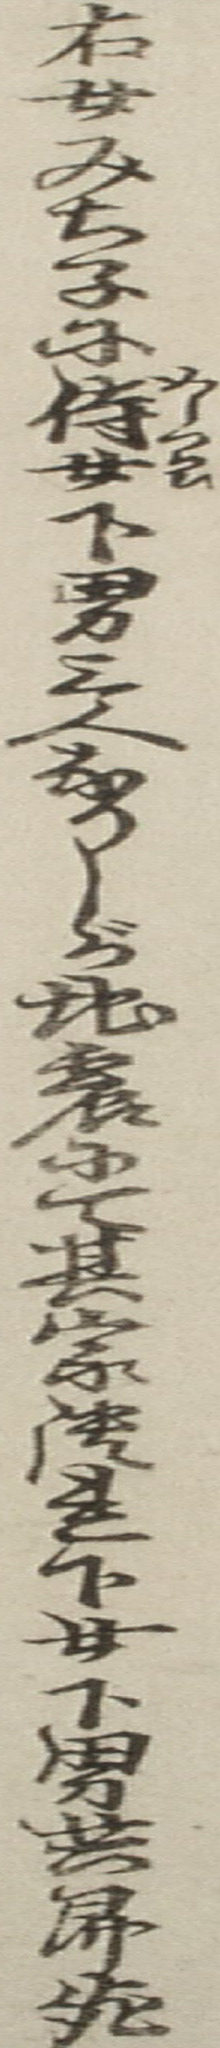右女みち子に侍女下男三人なりしが地震にて其家潰れ下女下男共即死
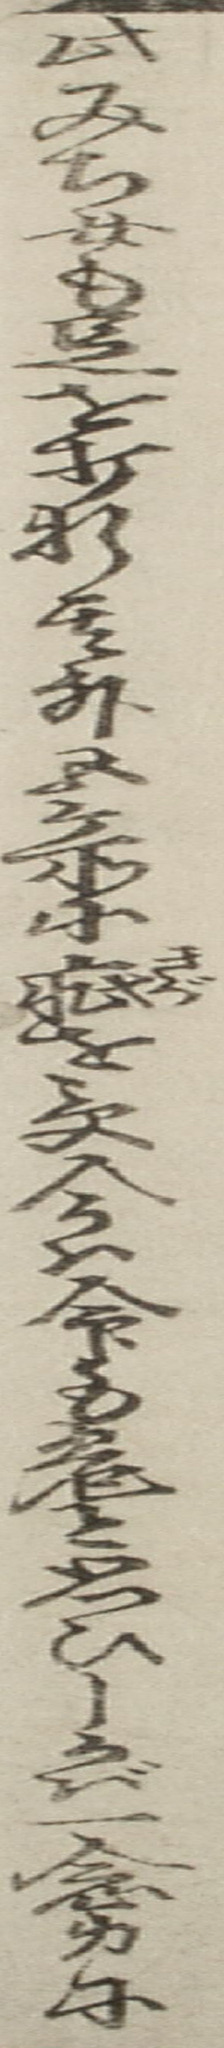此みち女も足を打折其外五ヶ所に疵を受今は命も危と思ひしかば一念力に
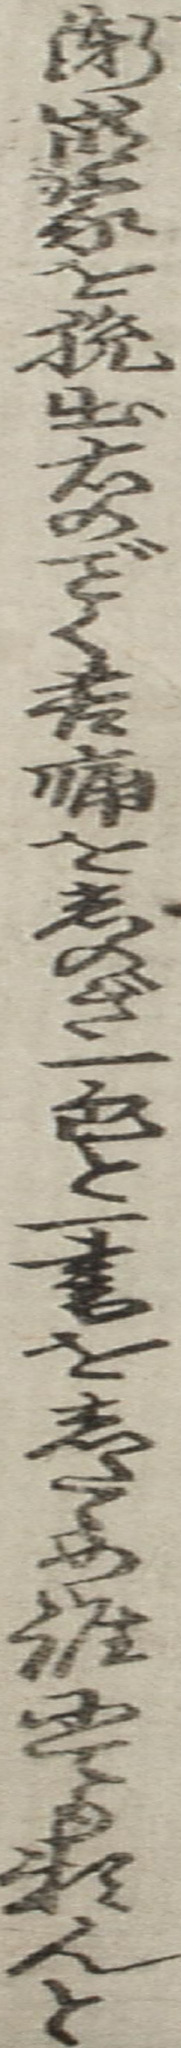漸崩家を脱出右のごとく苦痛をしのぎ一包と一書をしたゝめ誰にても頼んと
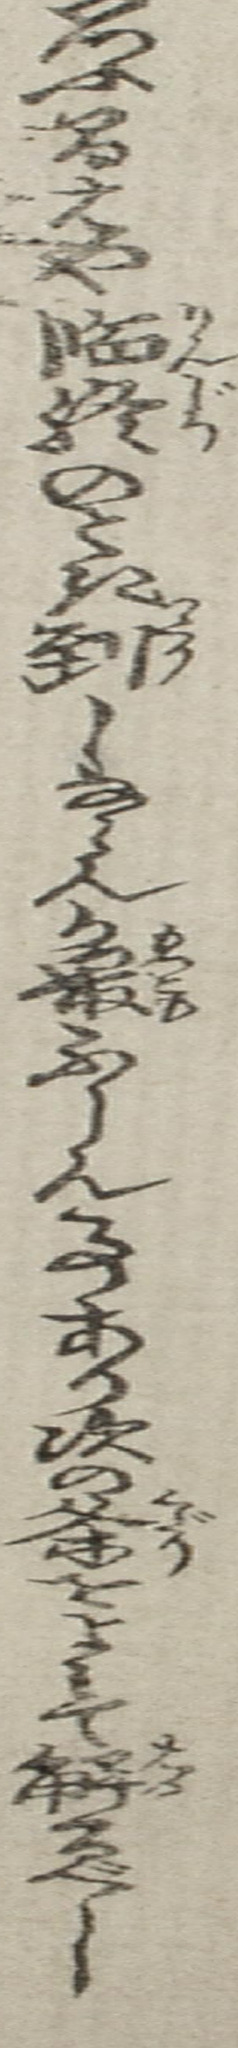思ふ間はや臨終のとき到しならんか最ふしん事あり次の条をよみて解るべし
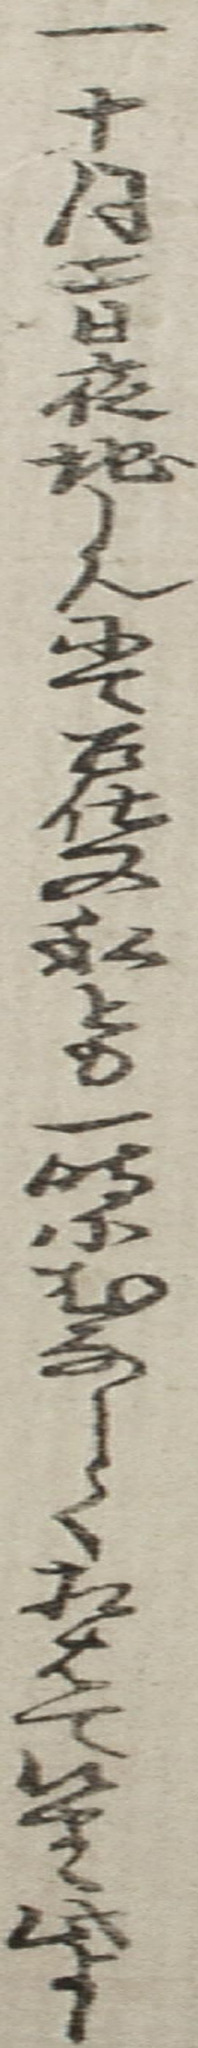一十月二日夜地しんにて召仕又私とも一時にむなしく相はて候まゝ此よし
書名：安政見聞誌　下
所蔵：東京大学地震研究所図書室 Earthquake Research Institute Library, The University of Tokyo, JAPAN
